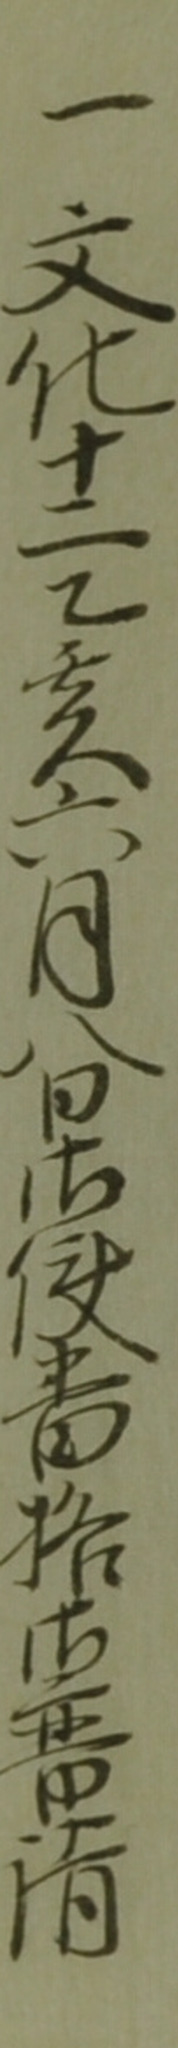一文化十二乙亥六月八日御使番格御普請
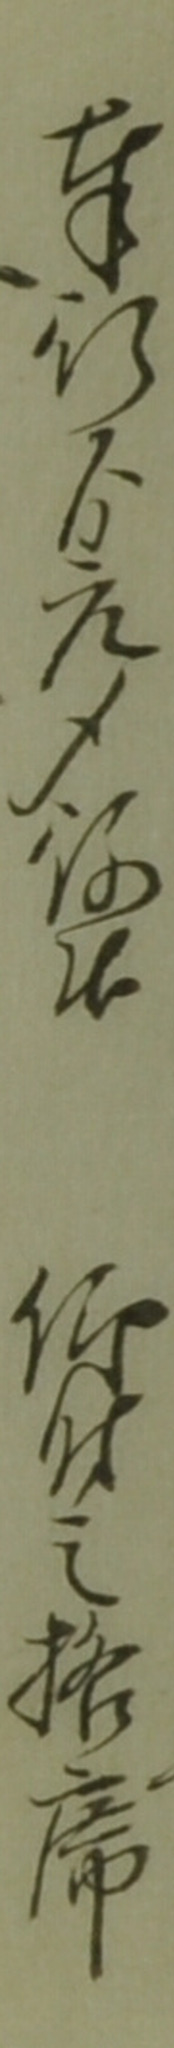奉行ゟ元〆役被仰付之格席
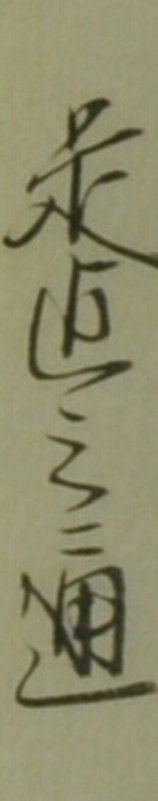是迄之通

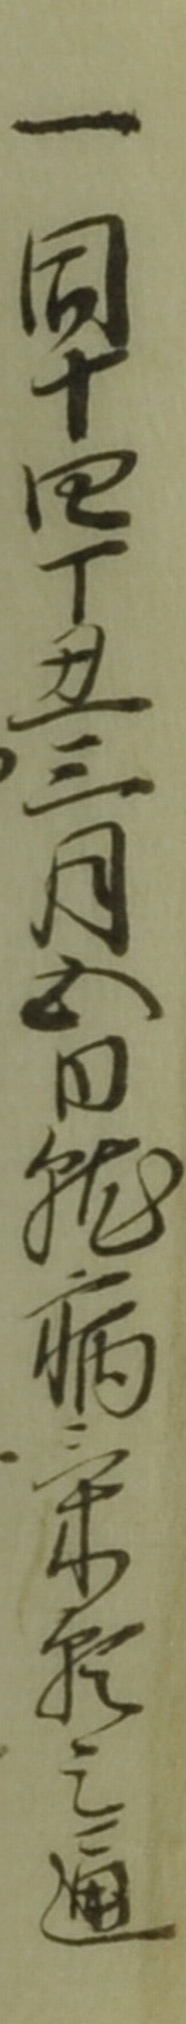一同十四丁丑三月五日就病気願之通
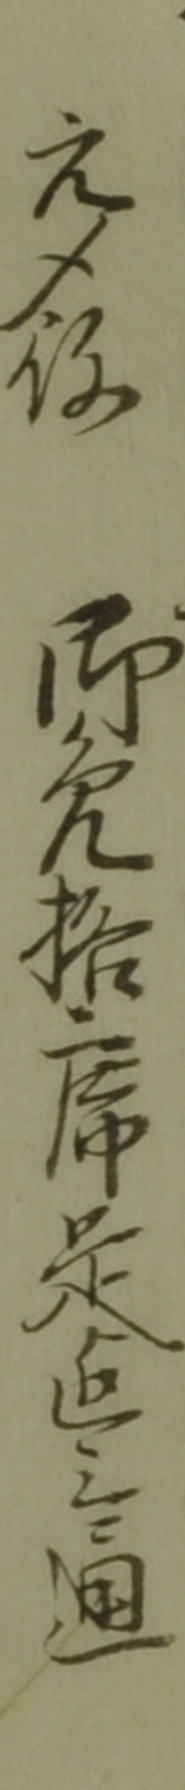元〆役御免格席是迄之通
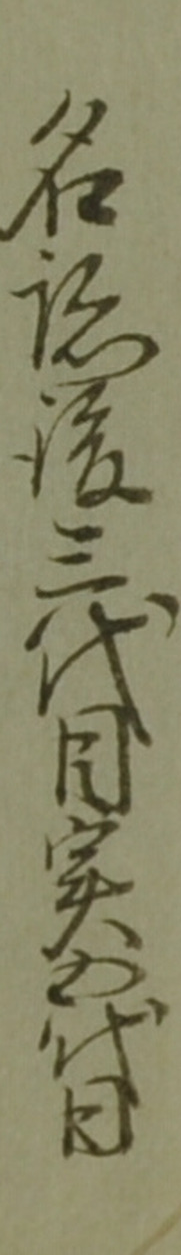名跡後三代目実五代目
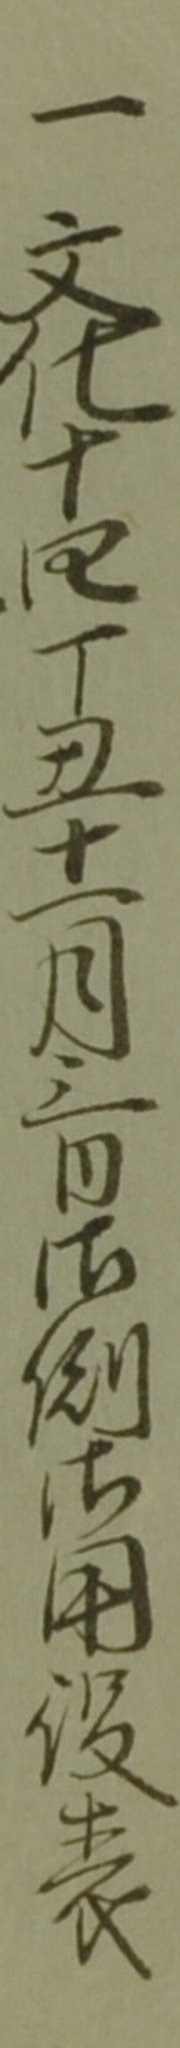一文化十四丁丑十一月三日御側御用役表
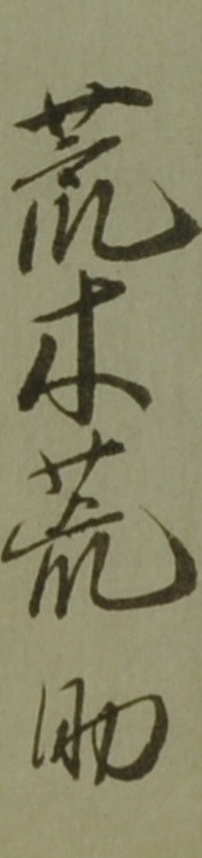荒木荒助
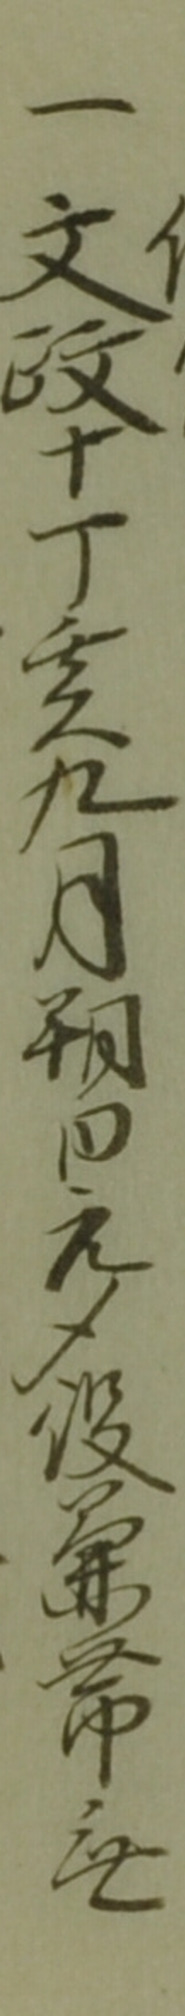一文政十丁亥九月朔日元〆役兼帯無
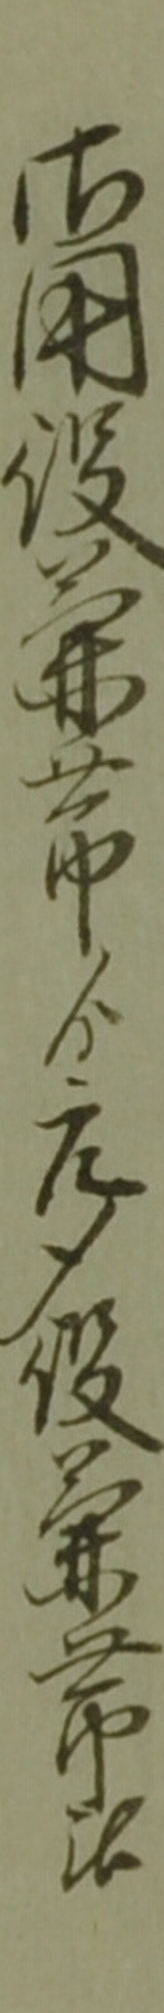御用役兼帯ゟ元〆役兼帯被
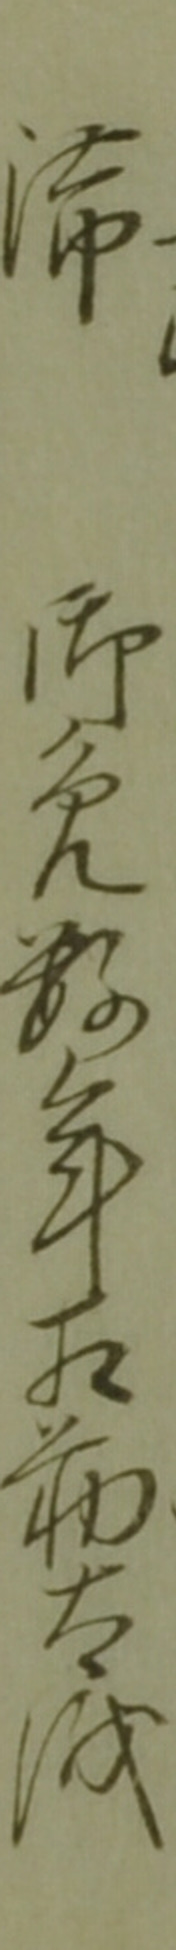滞御免数年相勤太儀
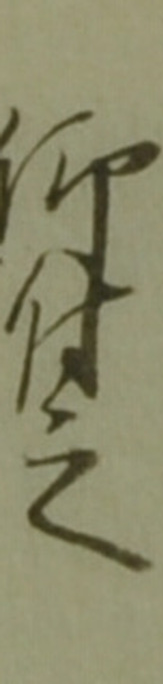仰付之
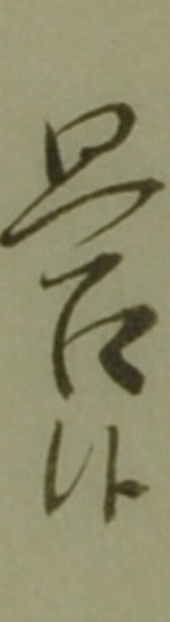思召候
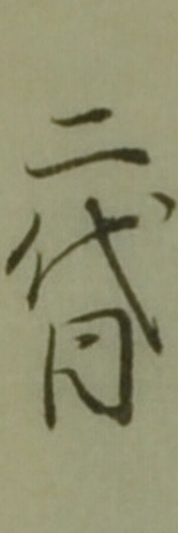二代目
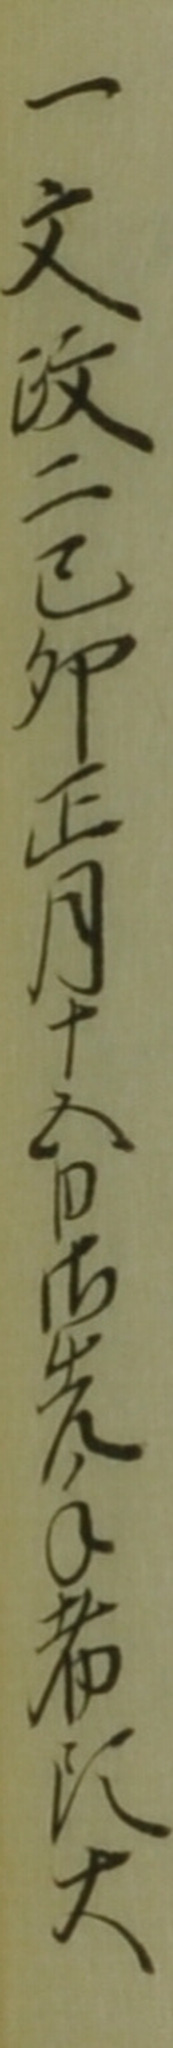一文政二己卯正月十五日御先手者頭大
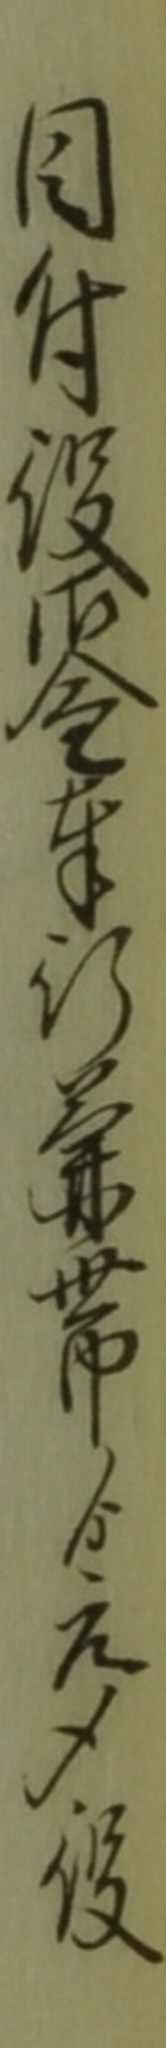目付役御金奉行兼帯ゟ元〆役
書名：諸御役代々録（七）
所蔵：伊那市立高遠町図書館・合同会社AMANE
